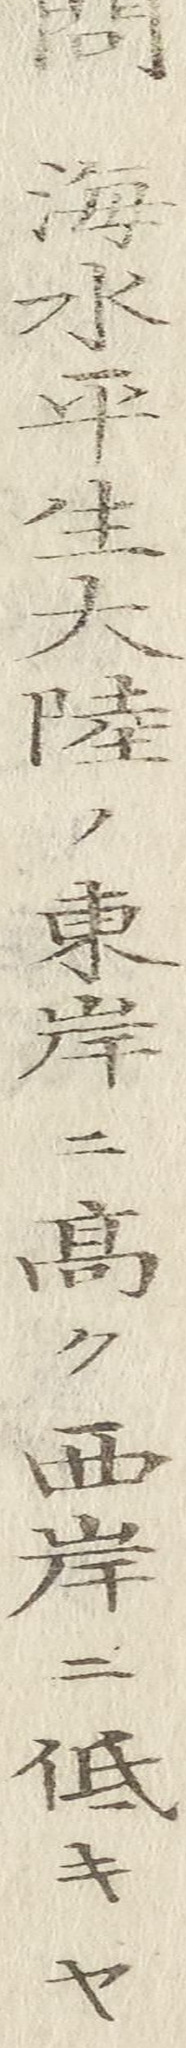問海水平生大陸ノ東岸ニ高ク西岸ニ低キヤ
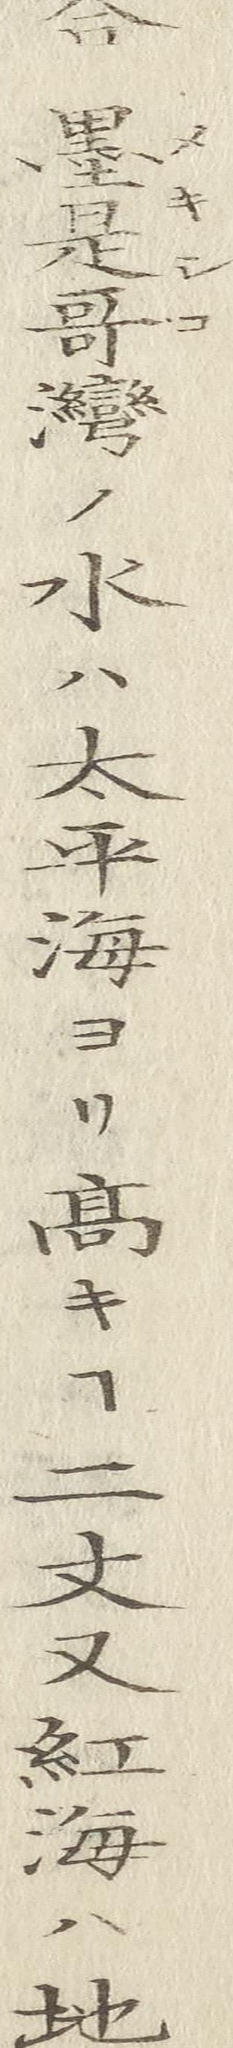答墨是哥湾ノ水ハ太平海ヨリ高キコト二丈又紅海ハ地
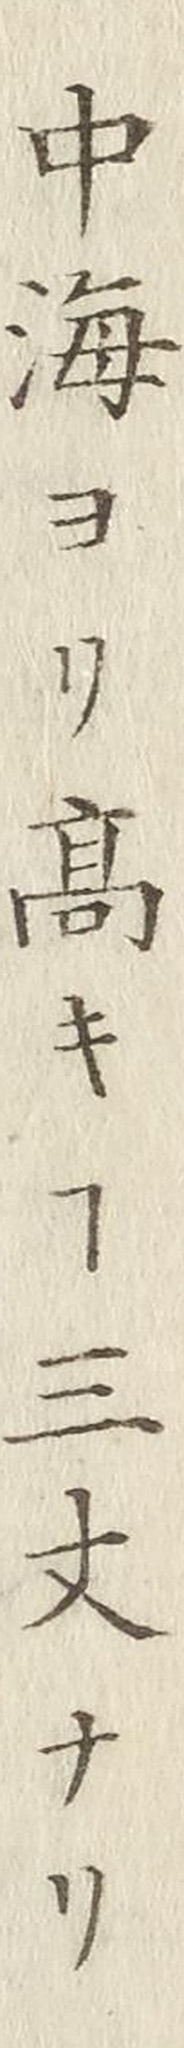中海ヨリ高キコト三丈ナリ
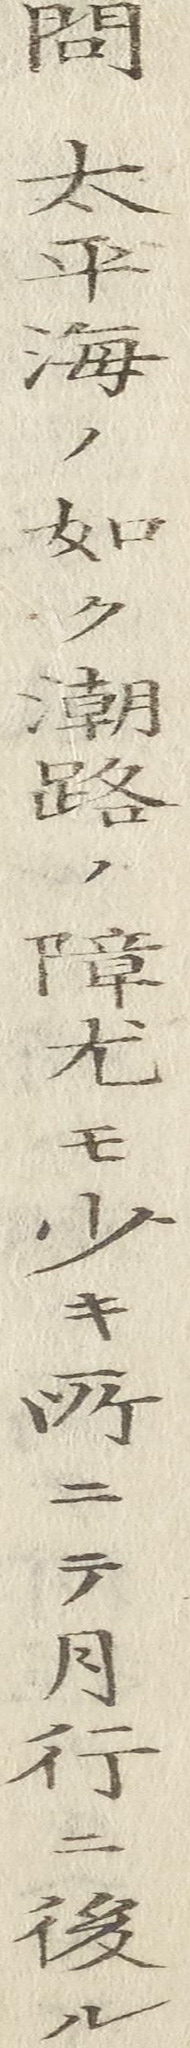問太平海ノ如ク潮路ノ障尤モ少キ所ニテ月行ニ後ル
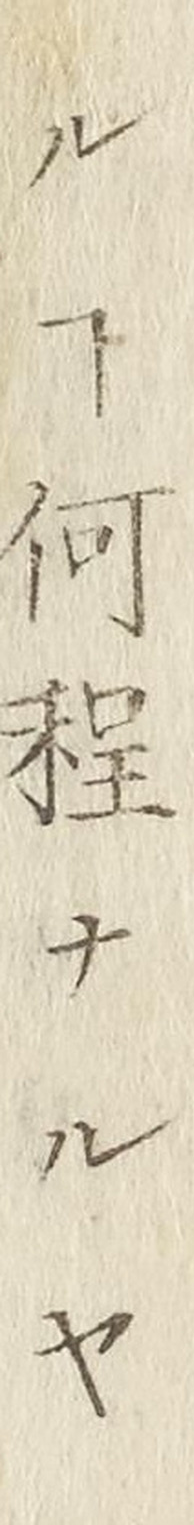ルコト何程ナルヤ
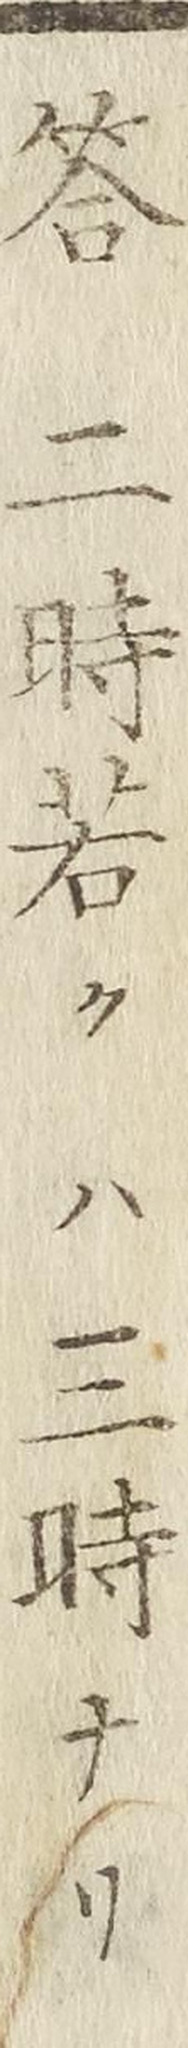答二時若クハ三時ナリ

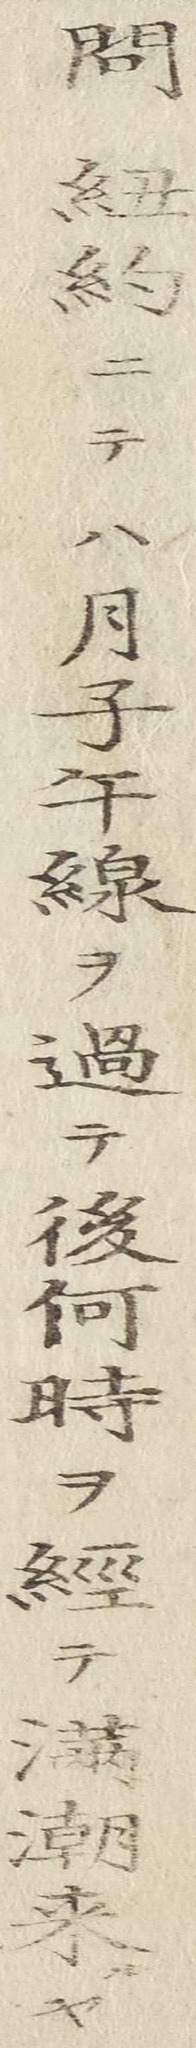問紐約ニテハ月子午線ヲ過テ後何時ヲ経テ満潮来ルヤ
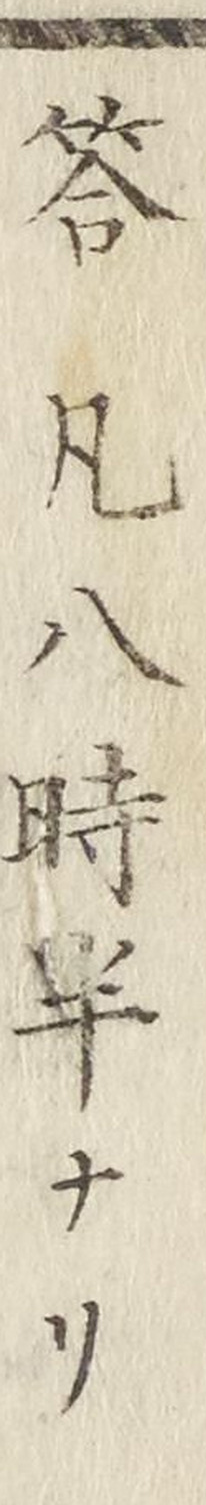答凡八時半ナリ
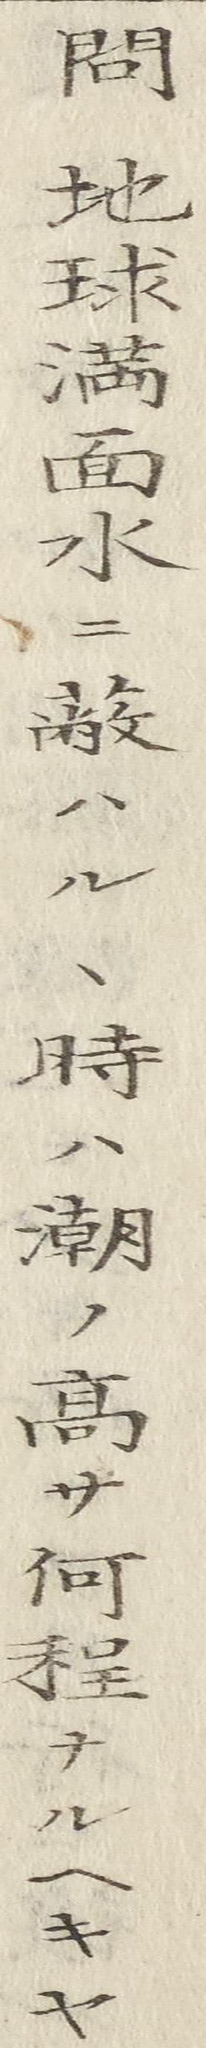問地球満面水ニ蔽ハルヽ時ハ潮ノ高サ何程ナルヘキヤ
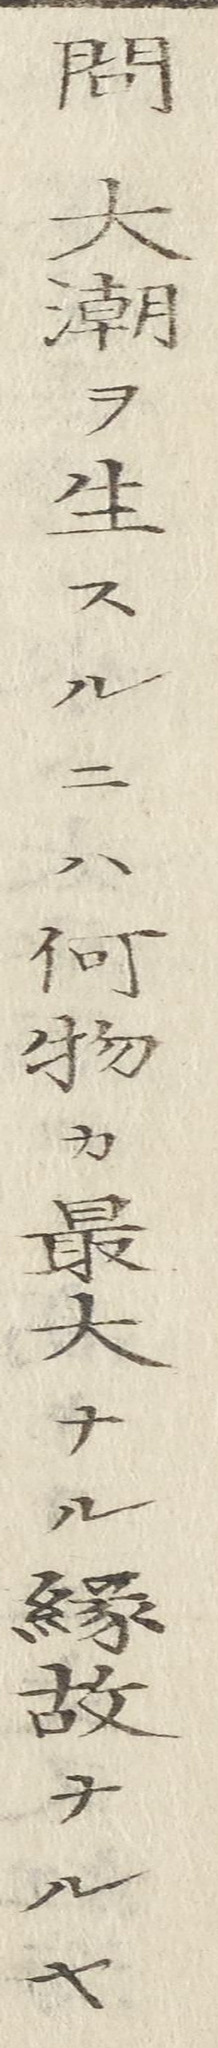問大潮ヲ生スルニハ何物カ最大ナル縁故ナルヤ
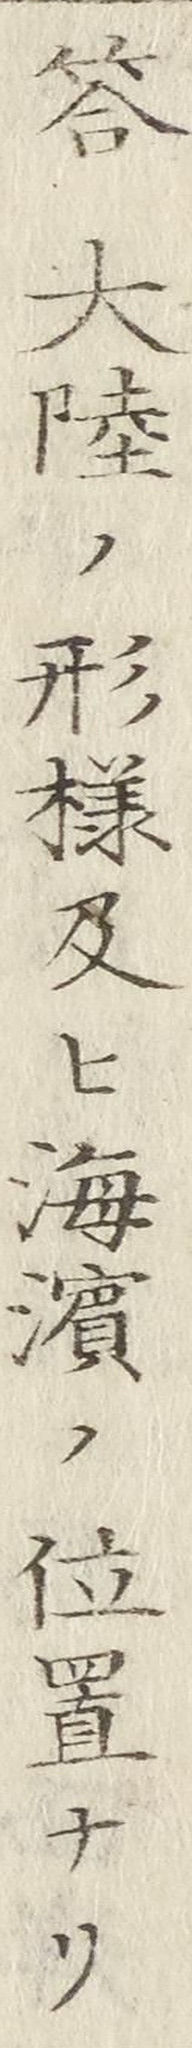答大陸ノ形様及ヒ海浜ノ位置ナリ
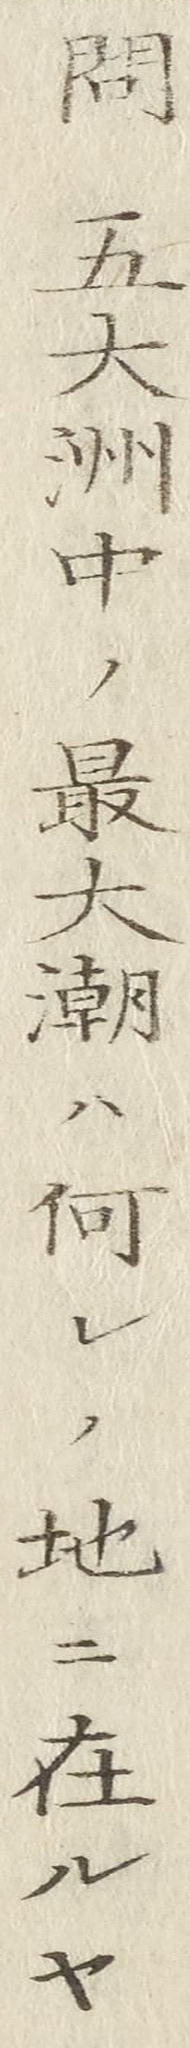問五大洲中ノ最大潮ハ何レノ地ニ在ルヤ
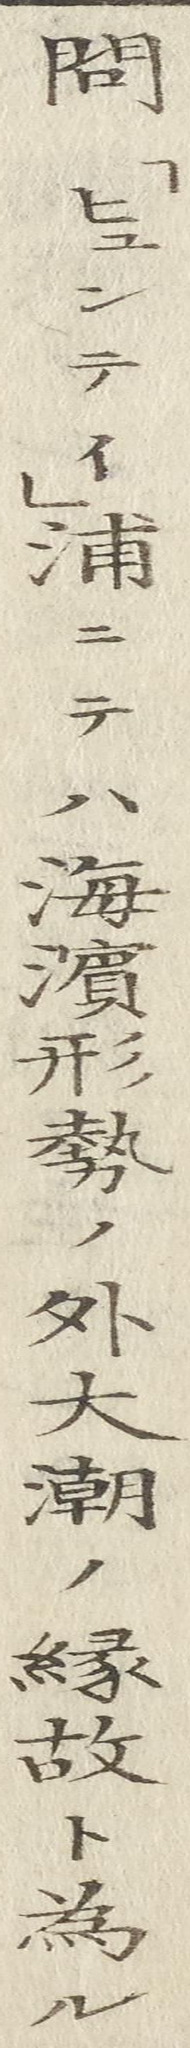問「ヒュンテイ」浦ニテハ海浜形勢ノ外大潮ノ縁故ト為ル
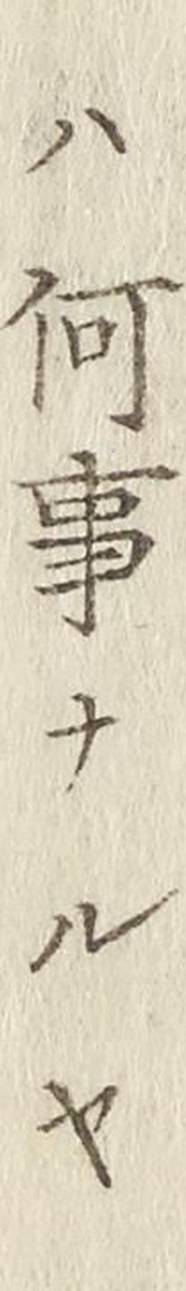ハ何事ナルヤ
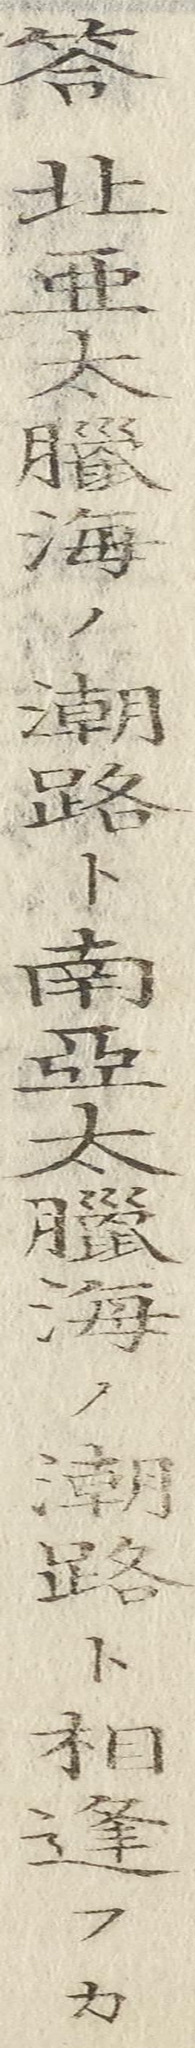答北亜太臘海ノ潮路ト南亜太臘海ノ潮路ト相逢フカ
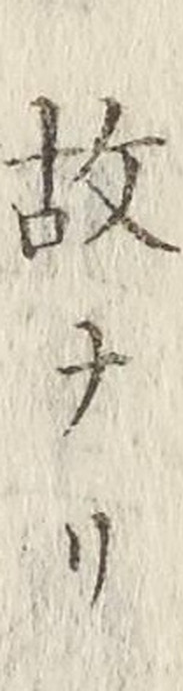故ナリ
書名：星学圖説　下
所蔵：東京大学地震研究所図書室 Earthquake Research Institute Library, The University of Tokyo, JAPAN
